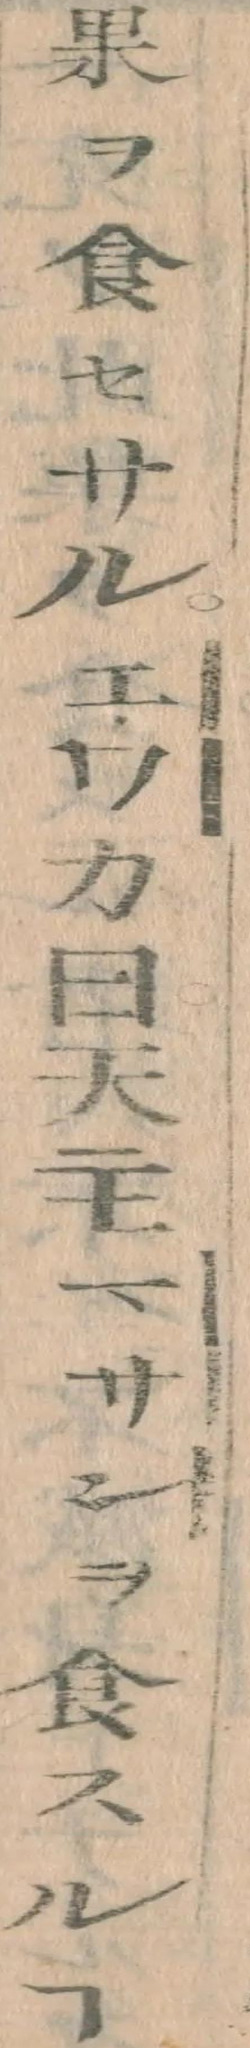果ヲ食セサル。エワカ曰。天主マサンヲ食スルヿ
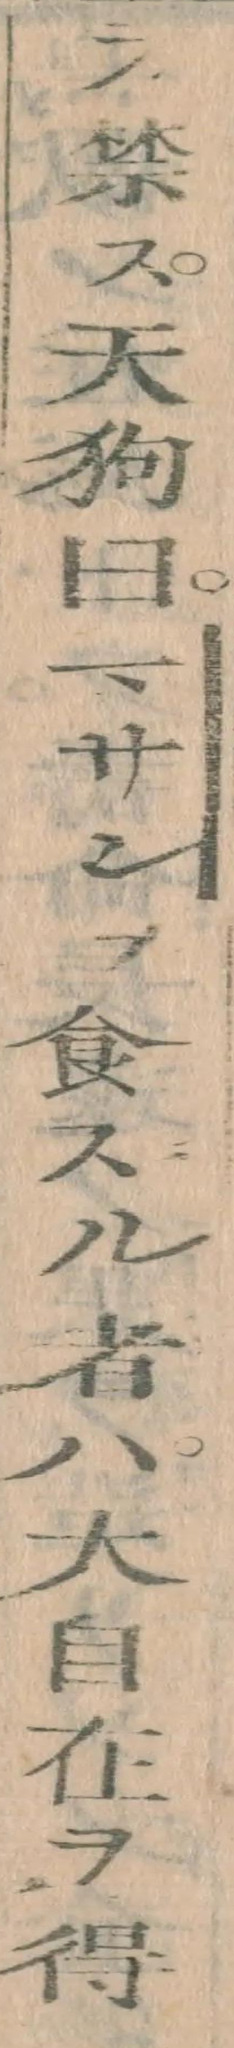ヲ禁ス。天狗曰。マサンヲ食スル者ハ。大自在ヲ得
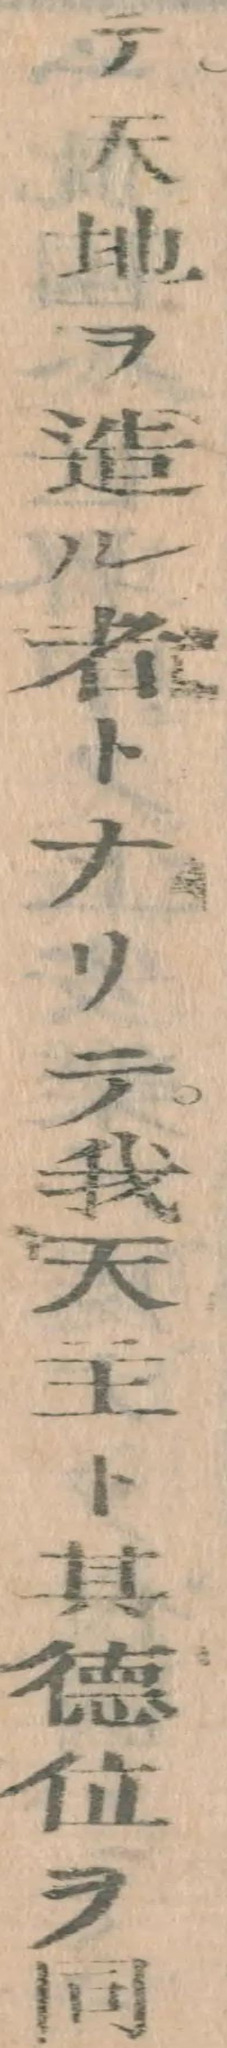テ。天地ヲ造ル者トナリテ。我天主ト其徳位ヲ同
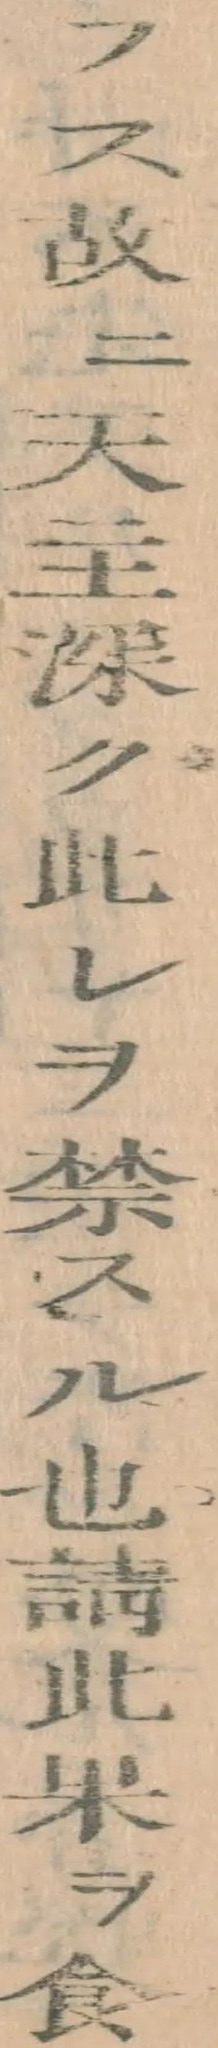フス故ニ天主深ク此レヲ禁スル也。請此果ヲ食
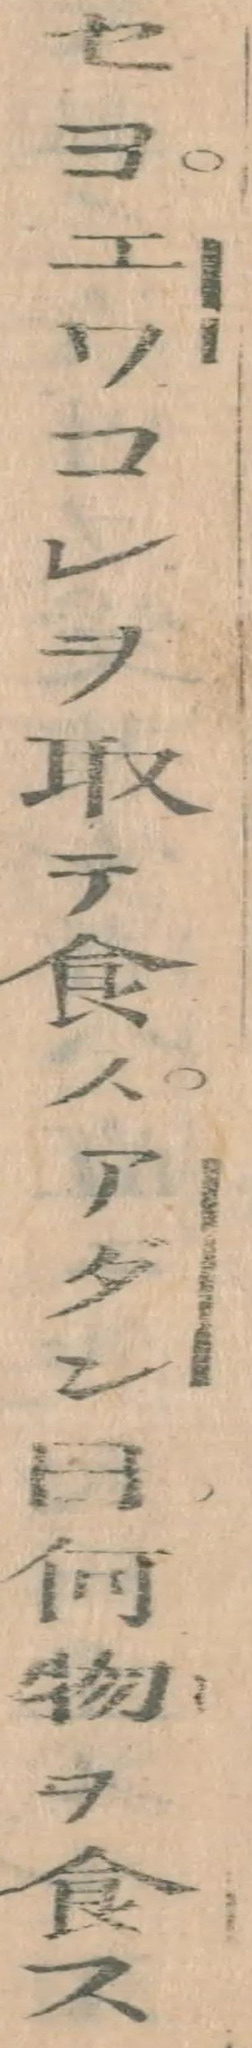セヨ。エワコレヲ取テ食ス。アダン曰。何物ヲ食ス
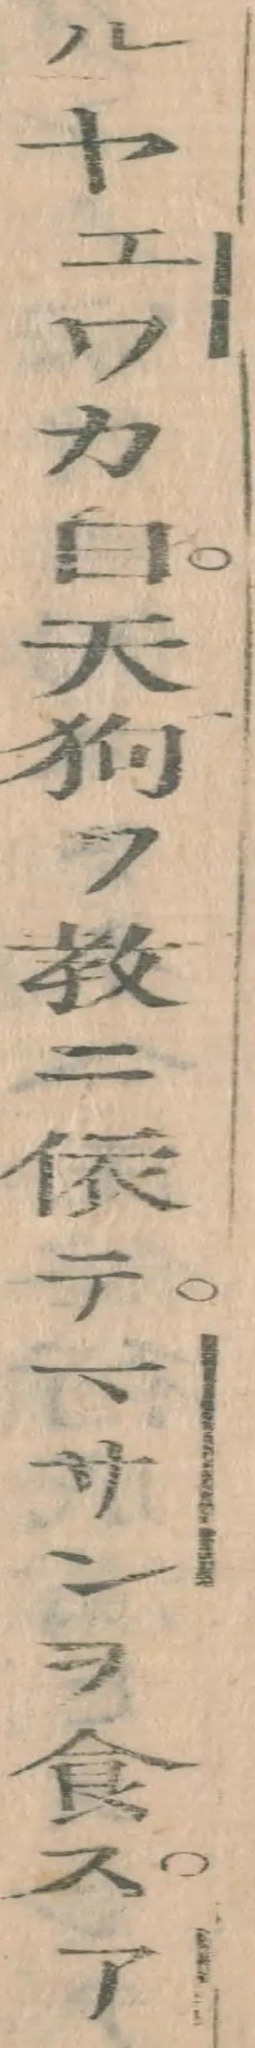ルヤエワカ曰。天狗ノ教ニ依テ。マサンヲ食ス。ア
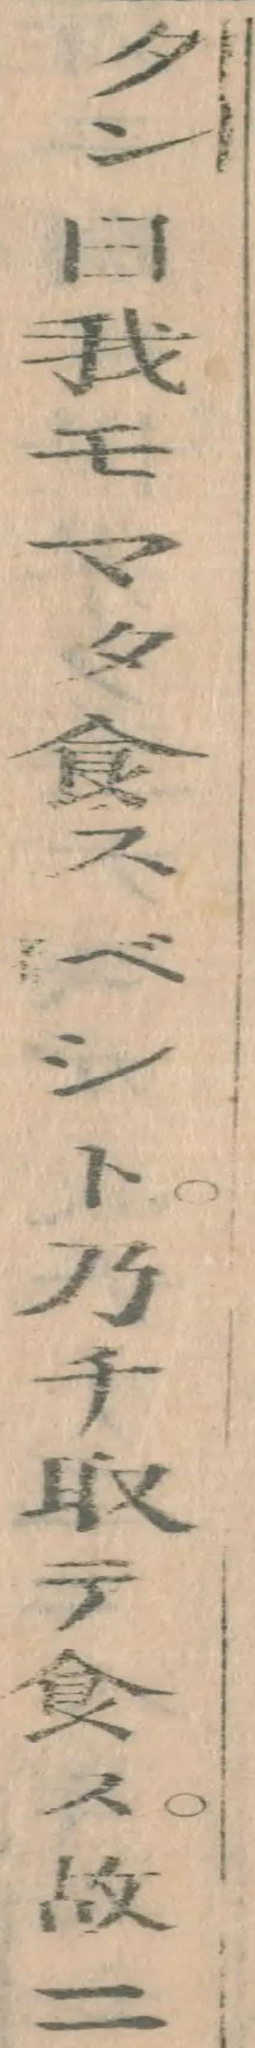タン曰我モマタ食スベシト。乃チ取テ食ス。故ニ
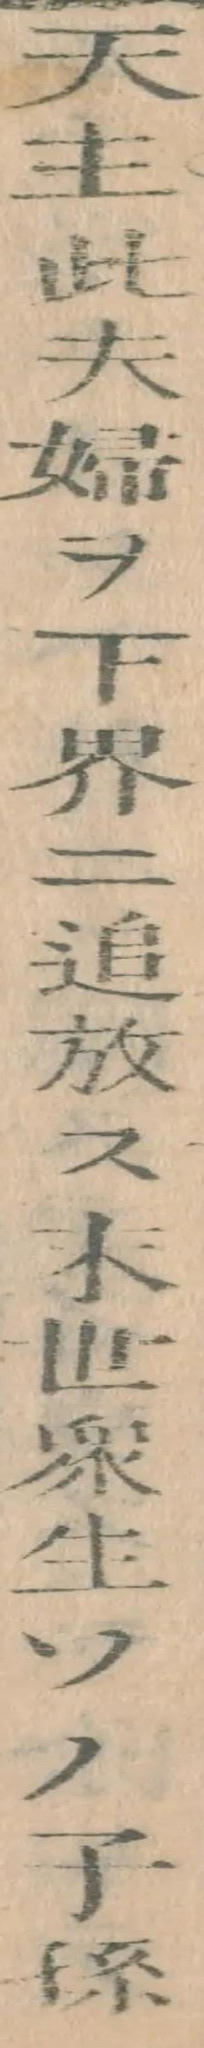天主。此夫婦ヲ下界ニ追放ス末世衆生ソノ子孫
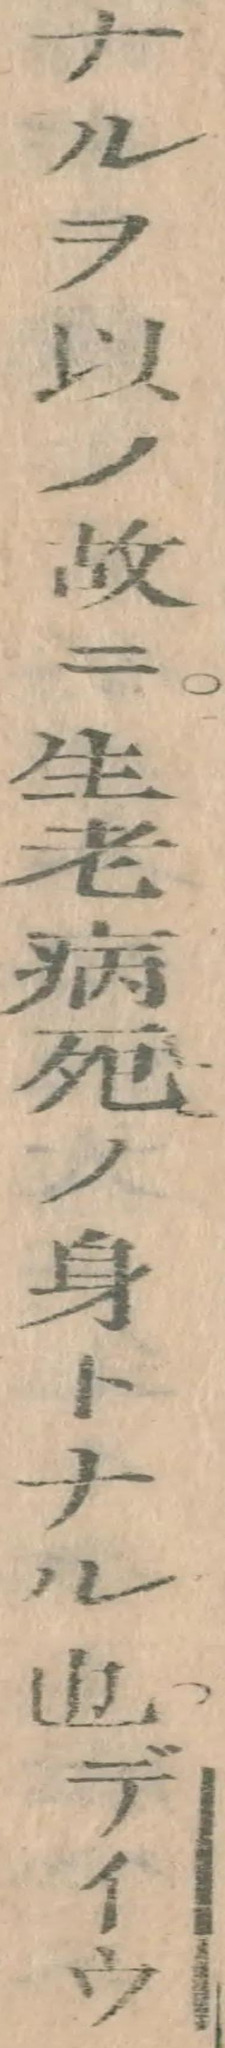ナルヲ以ノ故ニ。生老病死ノ身トナル也。デイウ
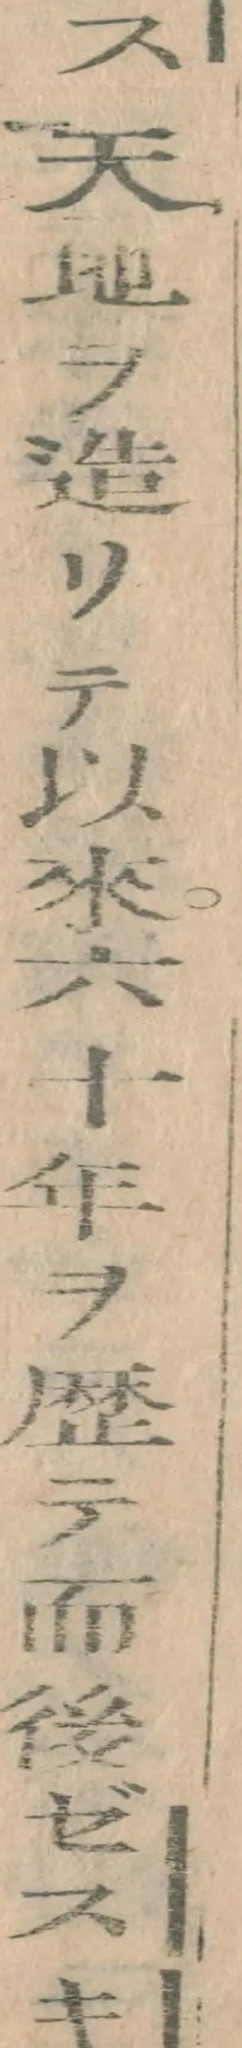ス天地ヲ造リテ以来。六十年ヲ歴テ而後ゼスキ
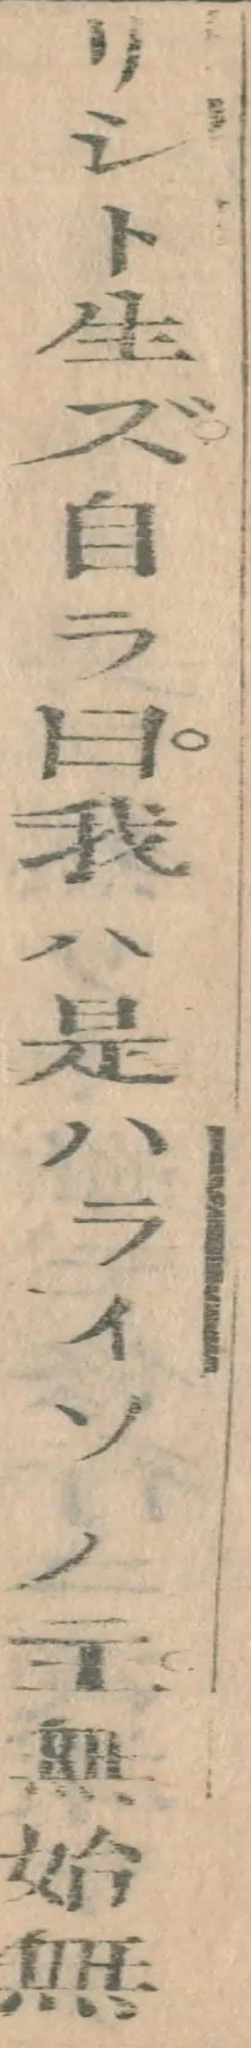リシト生ズ。自ラ曰。我ハ是ハライソノ主。無始無
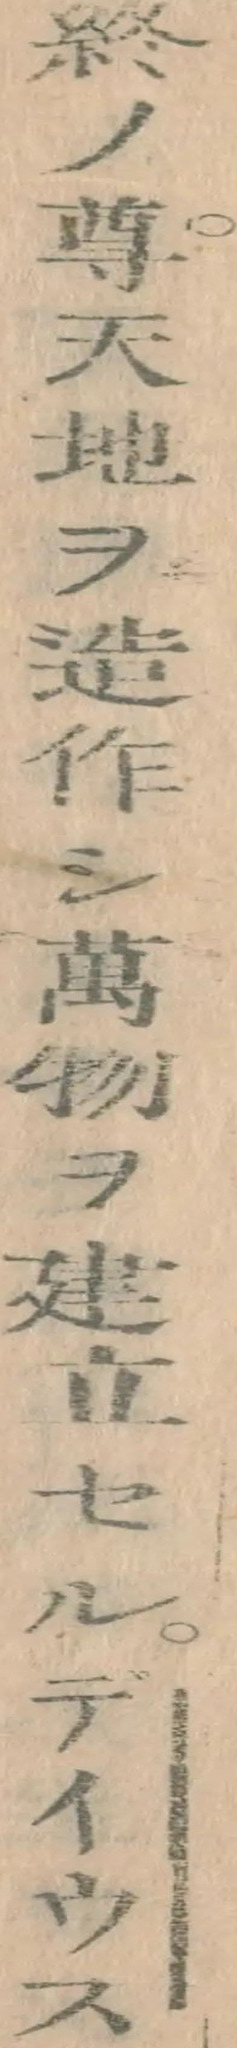終ノ尊。天地ヲ造作シ万物ヲ建立セル。デイウス
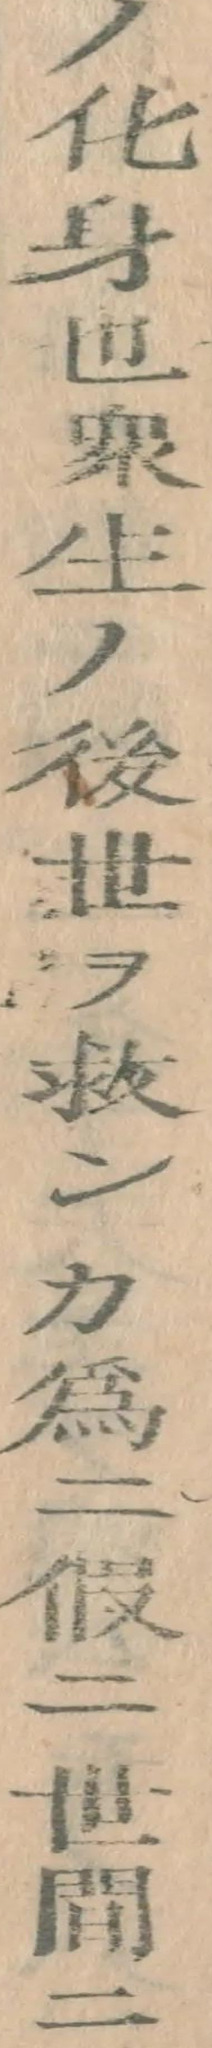ノ化身也。衆生ノ後世ヲ救ンカ為ニ。仮ニ世間ニ

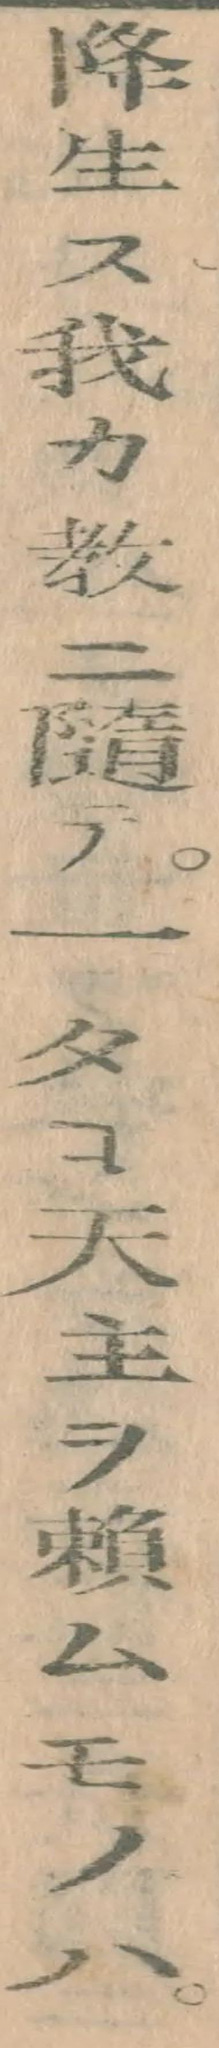降生ス。我カ教ニ随テ。一タヒ天主ヲ頼ムモノハ。
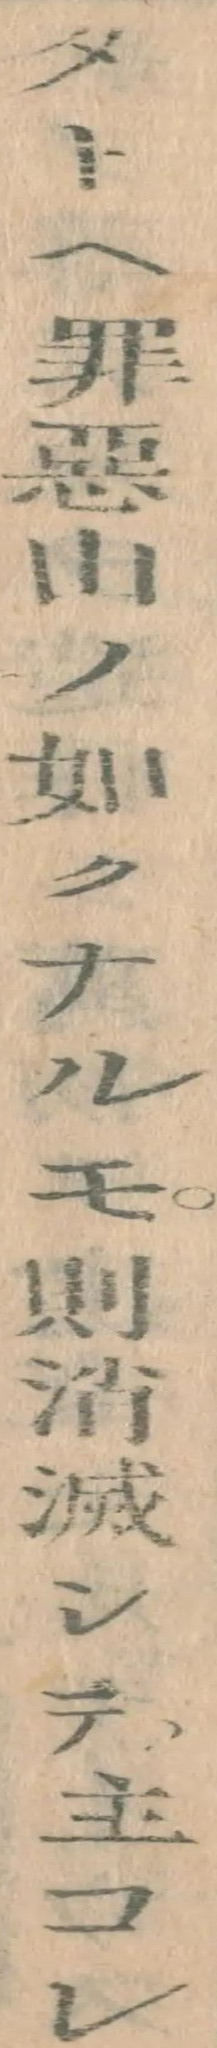タトヘ罪悪山ノ如クナルモ。則消滅シテ。主コレ
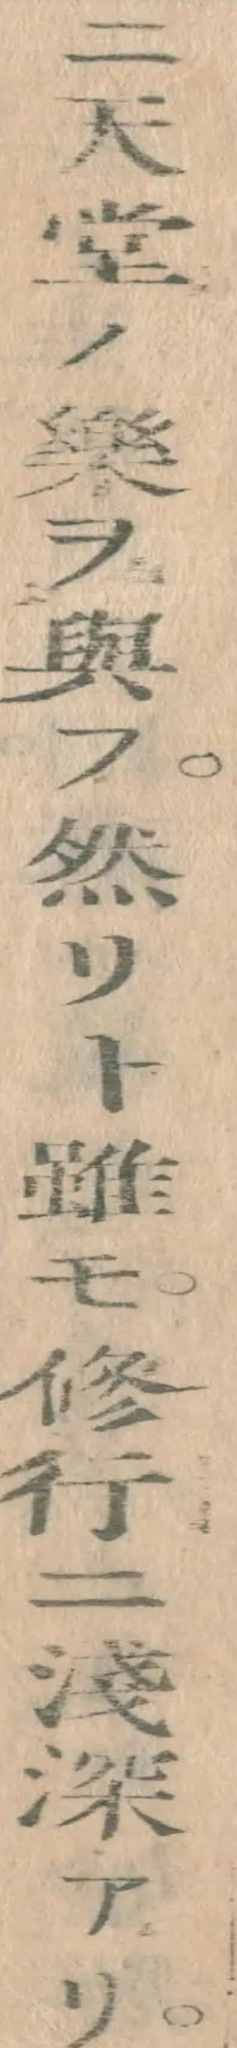ニ天堂ノ楽ヲ与フ。然リト雖トモ。修行ニ浅深アリ。
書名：南蛮寺興廃記
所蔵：国立国会図書館 National Diet Library, JAPAN
